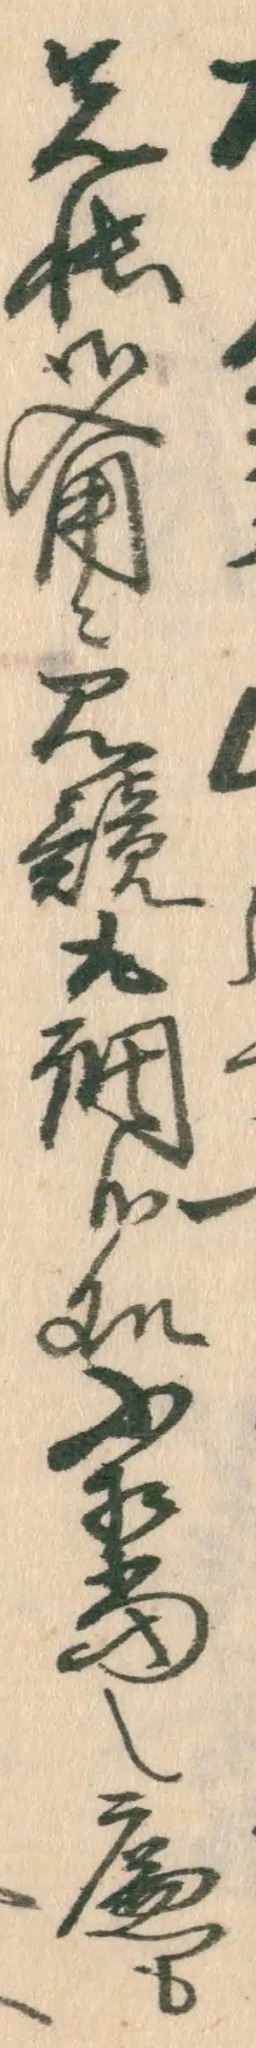先帳御入用ニ見競取調候処不相当之廉も
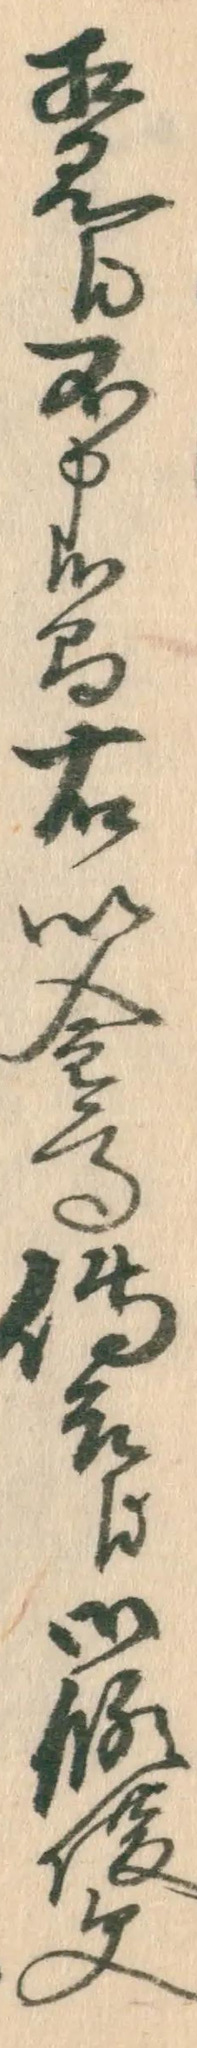相見え不申候間右以金高伝吉え御修復受
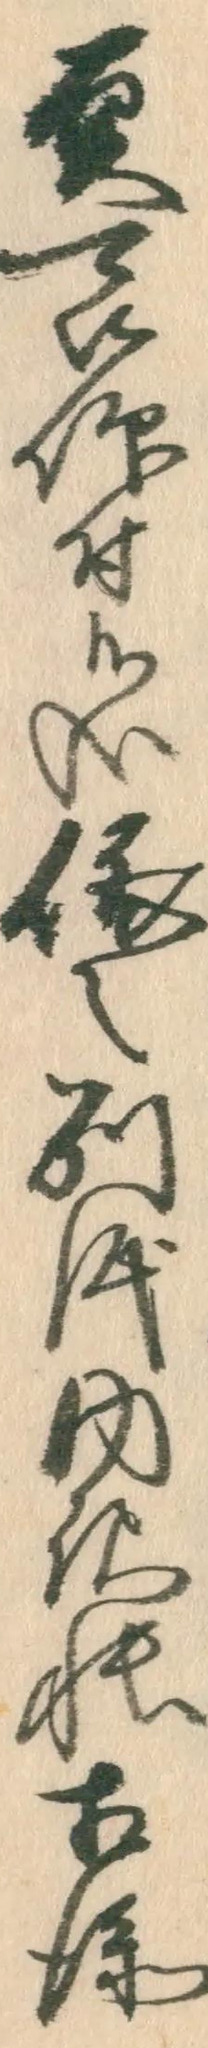負可被仰付候哉依之別紙内訳帳相添
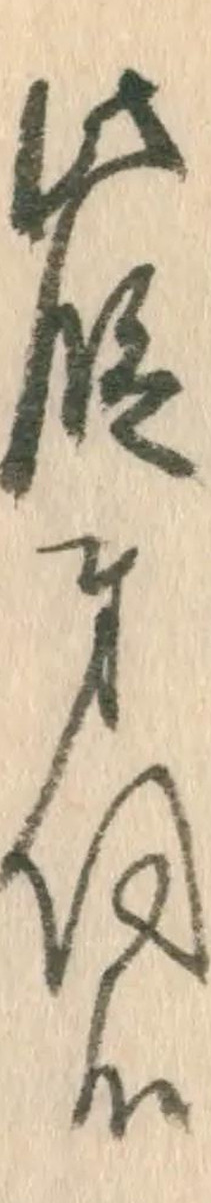此段奉伺候
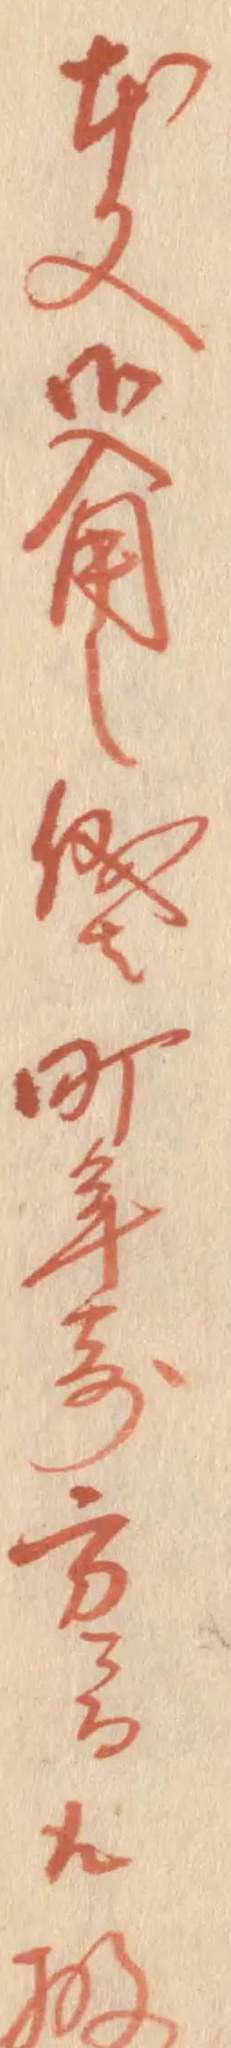本文御入用之儀は町年寄方ニ而取扱候

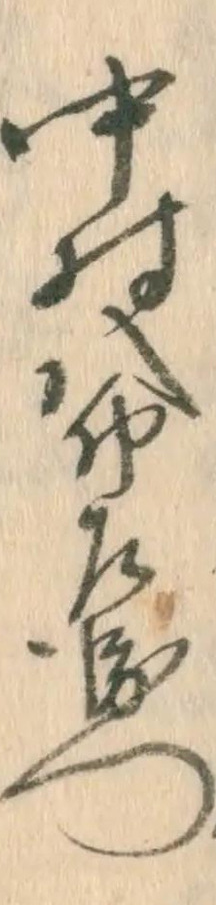中村八郎左衛門
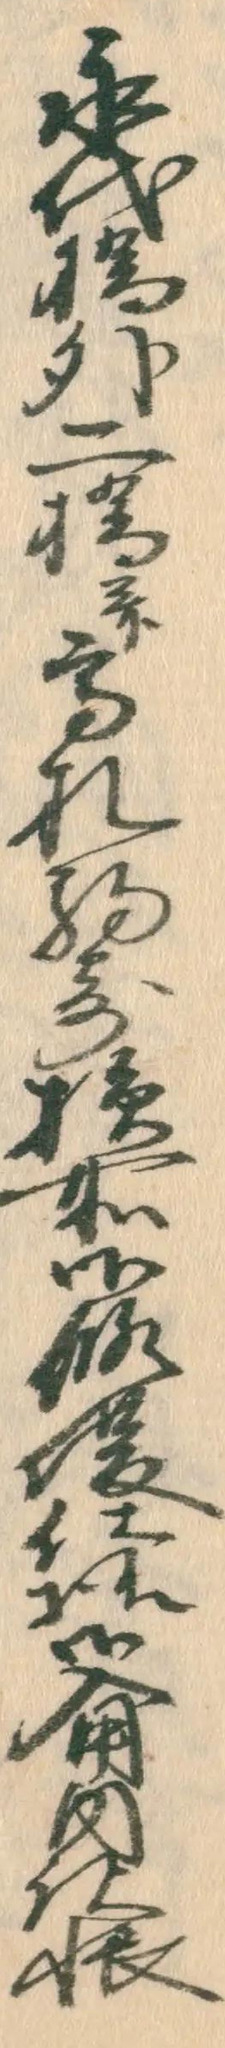永代橋外二橋并高札駒寄損所御修復仕様御入用内訳帳
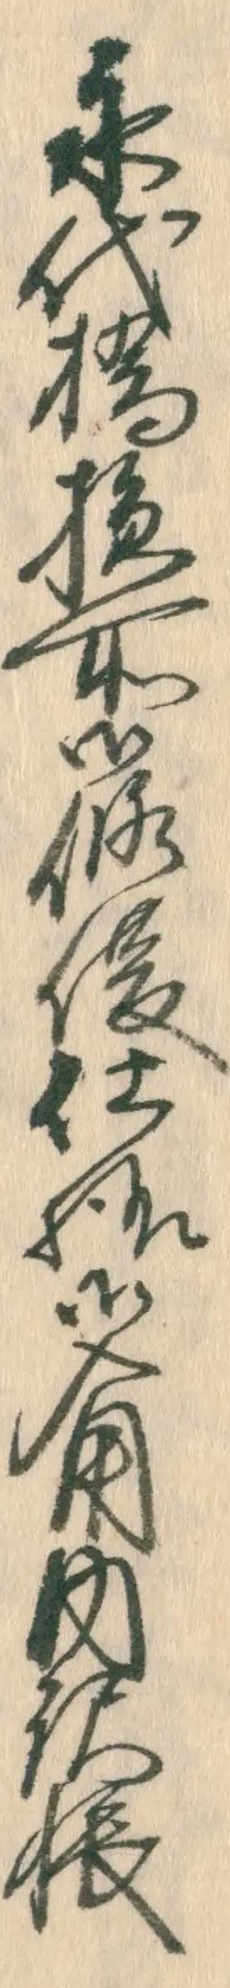永代橋損所御修復仕様御入用内訳帳
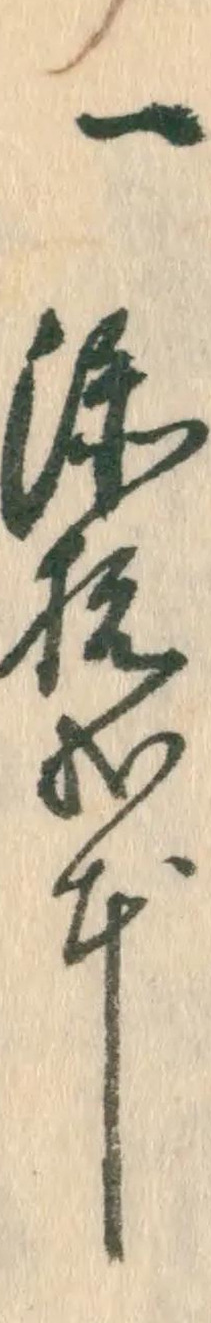一添杭弐本
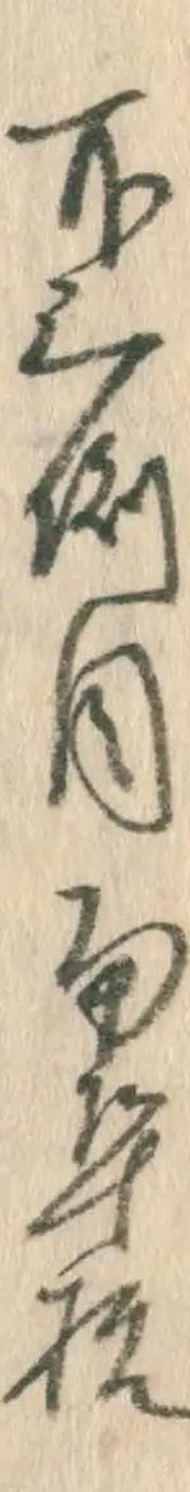廿三側目南耳杭朽腐
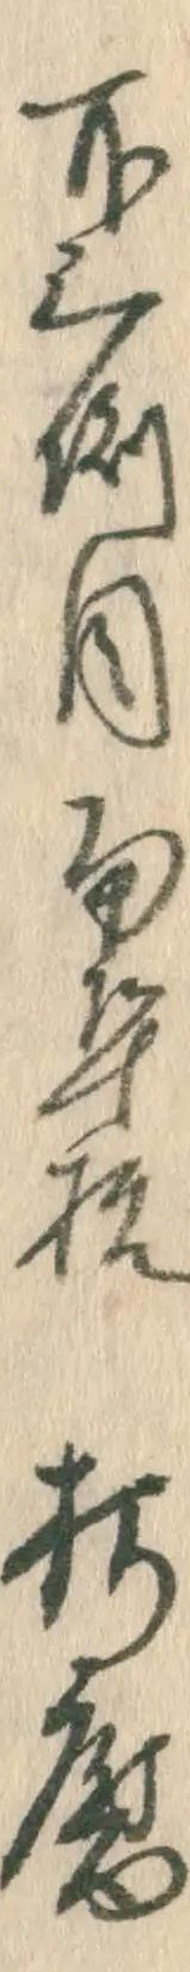廿三側目南耳杭朽腐

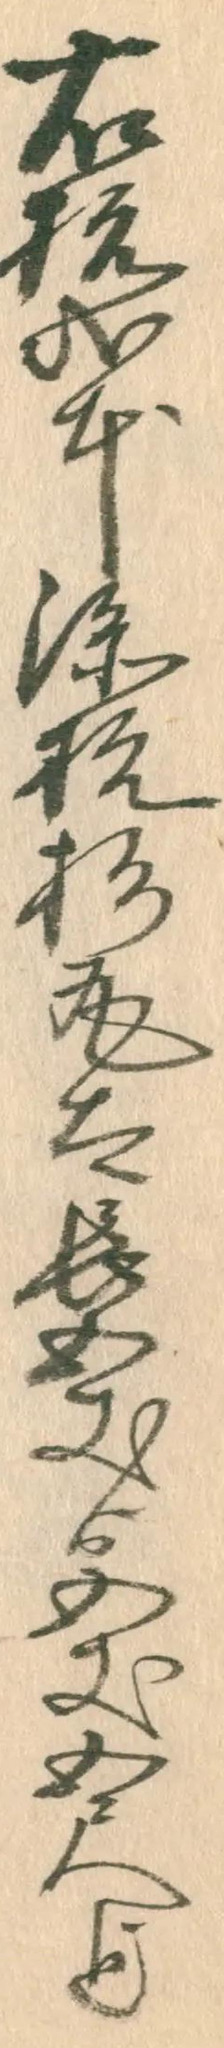右杭弐本添杭杉丸太長五丈ゟ五丈五尺迄
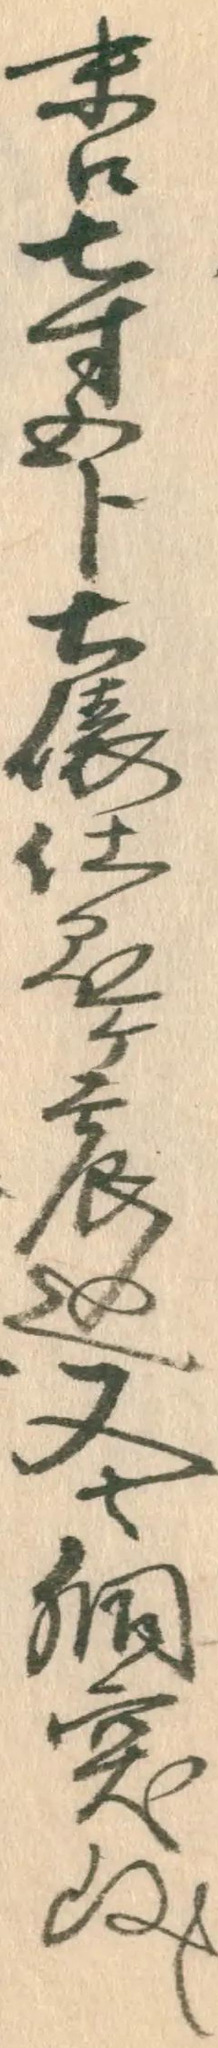末口七寸五分土俵仕懸ケ覆込又は胴突致し
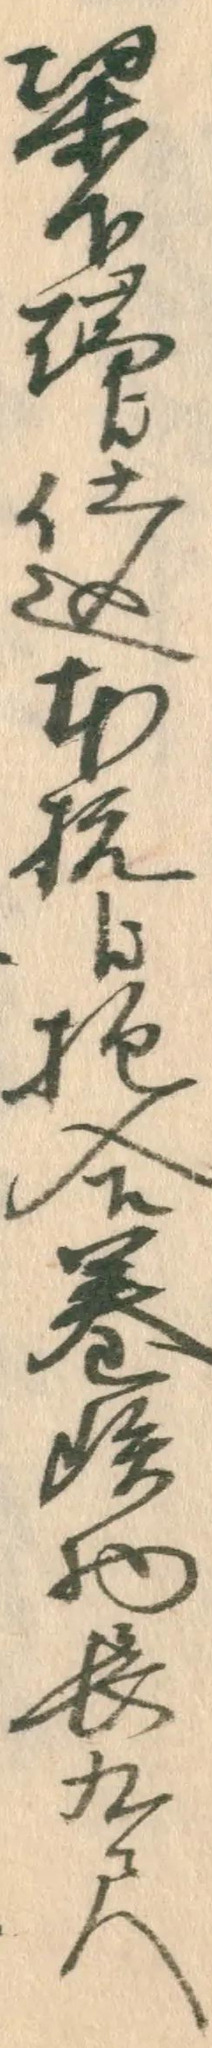梁下端え仕込本杭え抱合巻鉄物長九尺
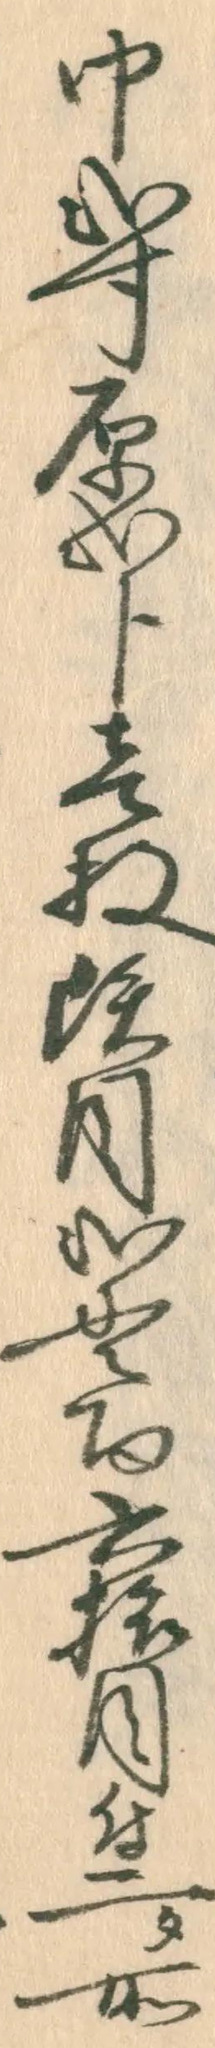巾弐寸厚弐分壱枚鉄目弐貫百六拾目付二タ所
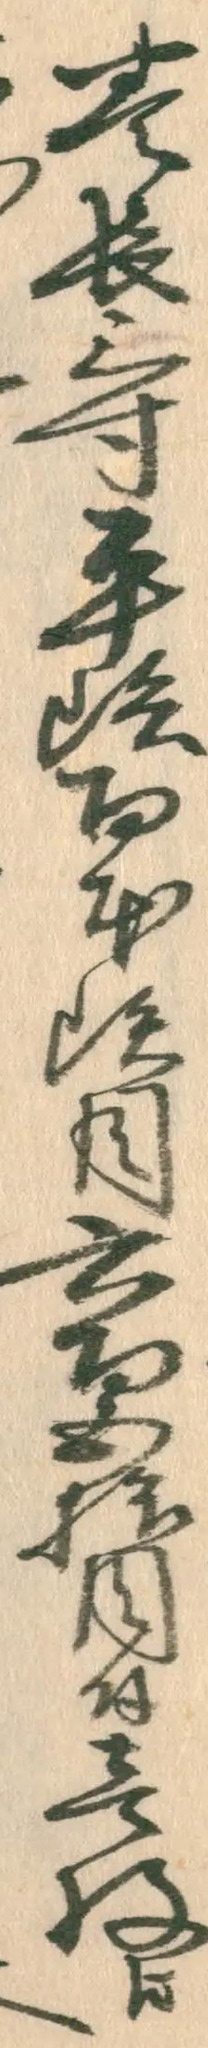巻長三寸平鋲百本鉄目六百五拾目付壱枚え
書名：三橋 17巻. [8] 三橋小破御修復書留　但御奉行御掛リ替地震潰橋番屋　嘉永四亥年より安政二卯年迄　下
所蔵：国立国会図書館 National Diet Library, JAPAN
